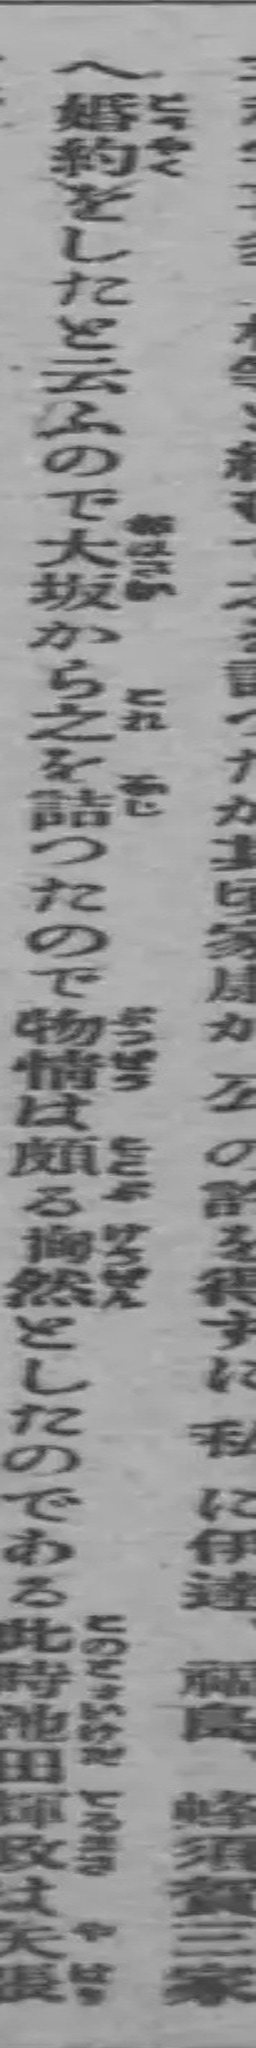へ婚約をしたと云ふので大坂から之を詰つたので物情は頗る拘然としたのである此時池田輝政は矢張
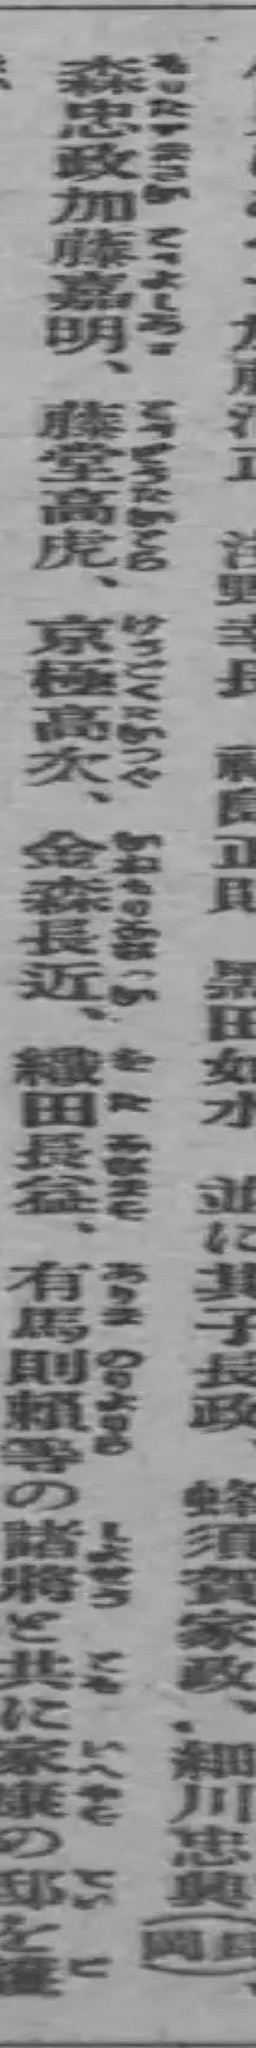森忠政加藤嘉明、藤堂高虎、京極高次、金森長近、織田長益、有馬則頼等の諸将と共に家康の邸を護
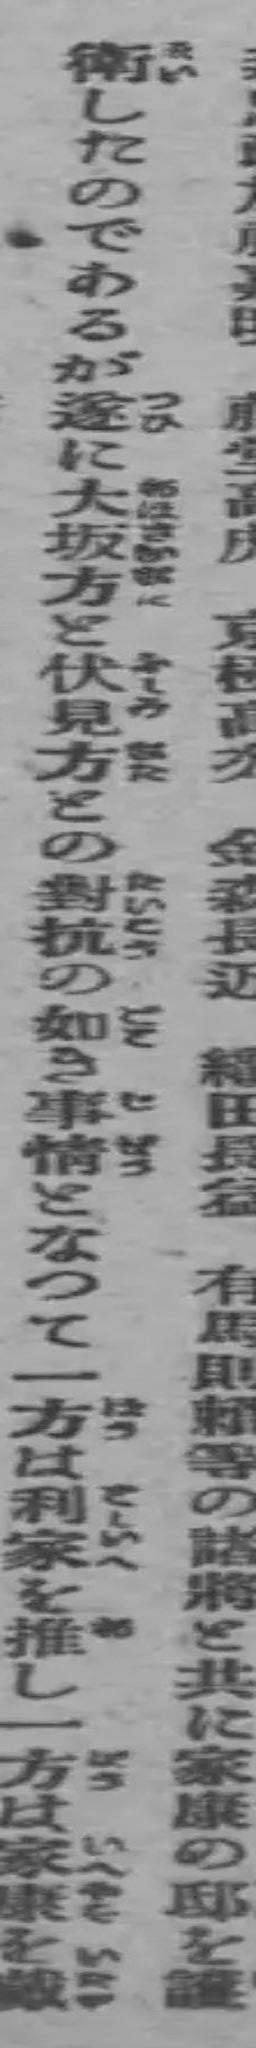衛したのであるが遂に大坂方と伏見方との対抗の如き事情となつて一方は利家を推し一方は家康を戴
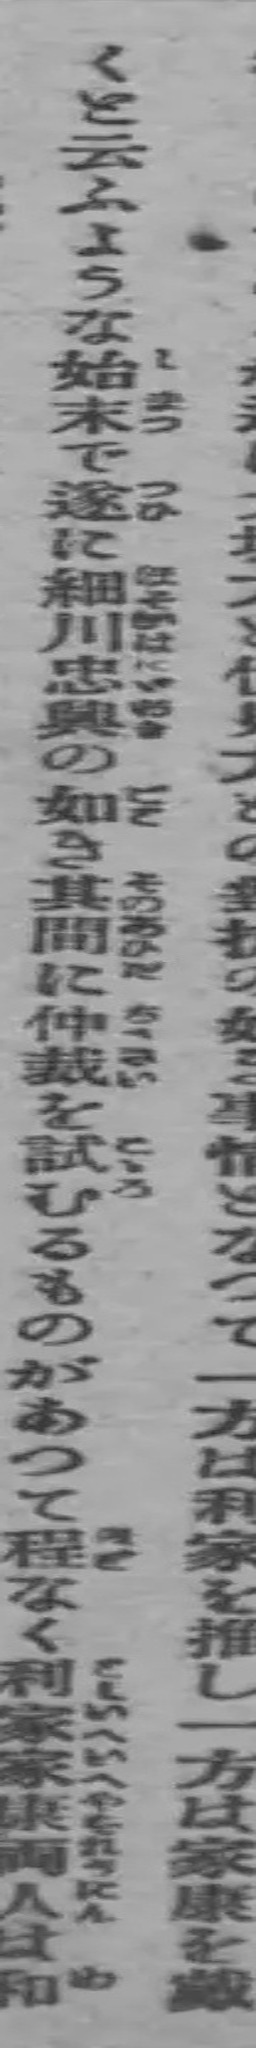くと云ふような始末で遂に細川忠興の如き其間に仲裁を試むるものあつて程なく利家家康両人は和
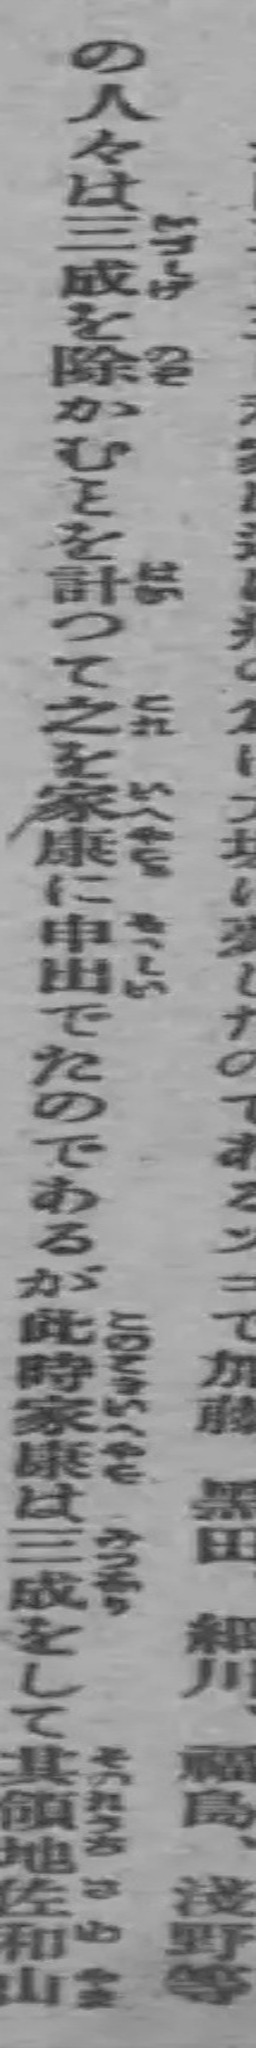三成屏居の人々は三成を除かむことを計つて之を家康に申出でたのであるが此時家康は三成をして其領地佐和山
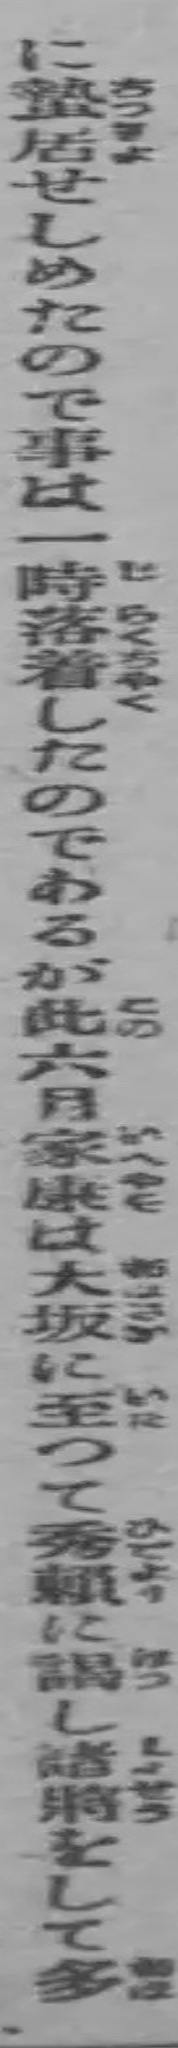に蟄居せしめたので事は一時落着したのであるが此六月家康は大坂に至つて秀頼に謁し諸将をして多
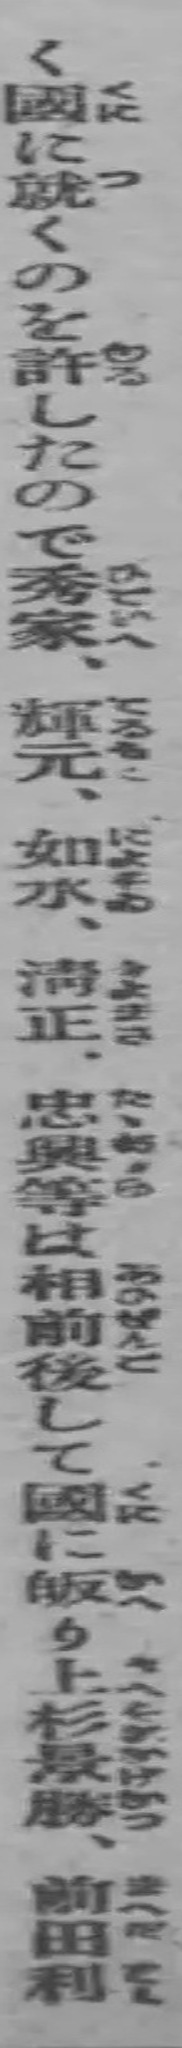く国に就くのを許したので秀家、輝元、如水、清正、忠興等は相前後して国に皈り上杉景勝、前田利
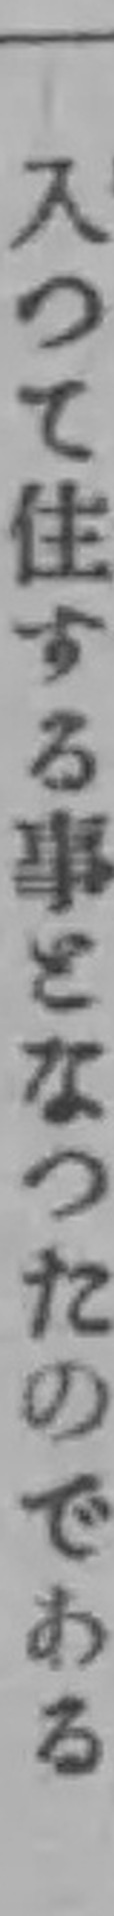入つて住する事となつたのである
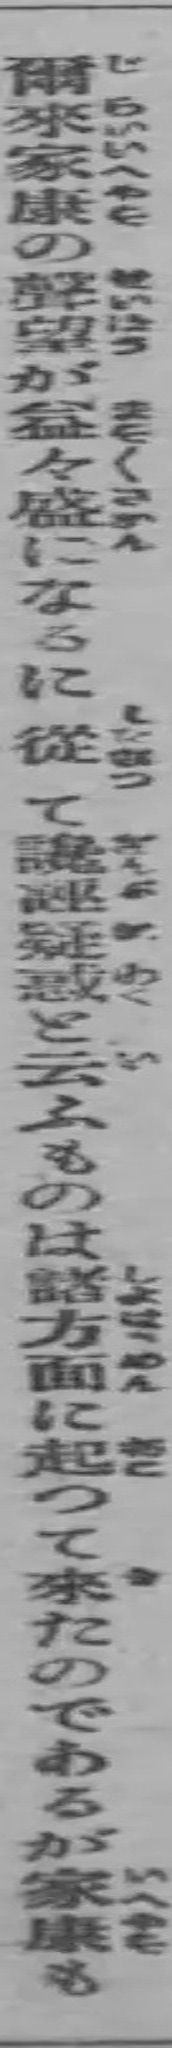爾来家康の声望が益々盛になるに従て讒誣疑惑と云ふものは諸方面に起つて来たのであるが家康も
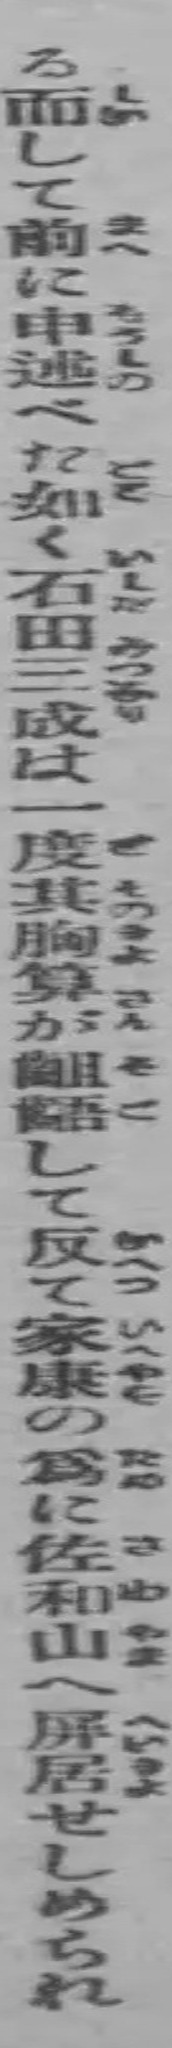る而して前に申述べた如く石田三成は一度其胸算が齟齬して反て家康の為に佐和山へ屏居せしめられ
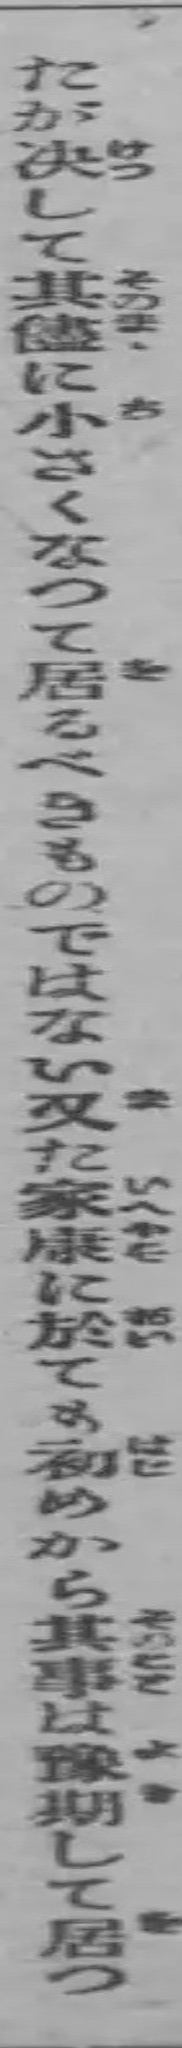たが決して其侭に小さくなつて居るべきものではない又た家康に於ても初めから其事は予期して居つ
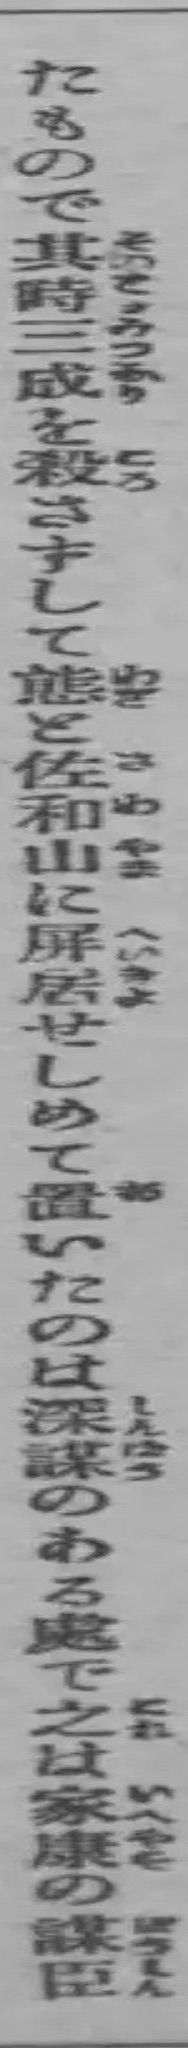たもので其時三成を殺さずして態と佐和山に屏居せしめて置いたのは深謀のある処で之は家康の謀臣
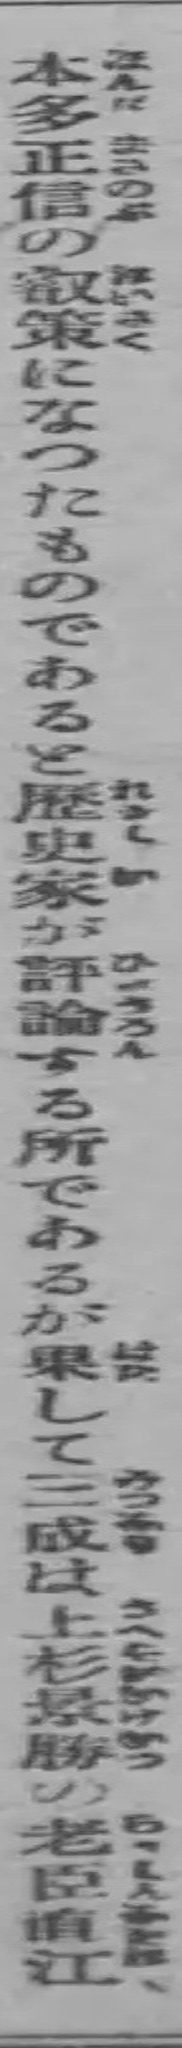本多正信の叡策になつたものであると歴史家が評論する所であるが果して三成は上杉景勝の老臣直江
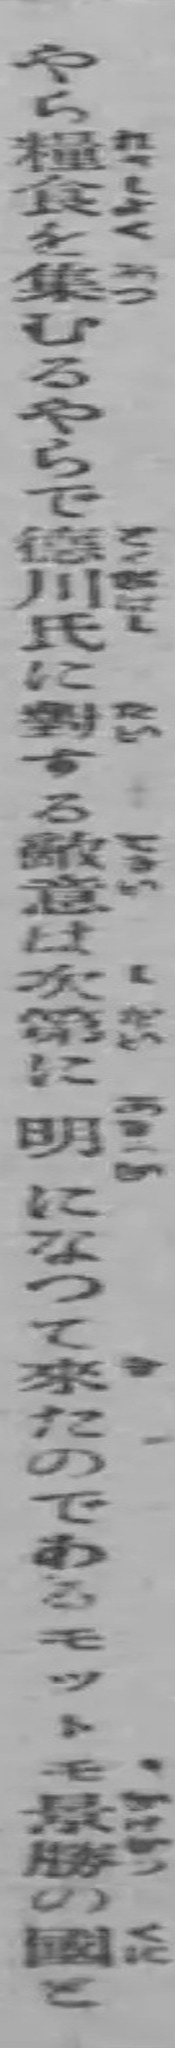やら糧食を集むるやらで徳川氏に対する敵意は次第に明になつて来たのであるモツトモ景勝の国と
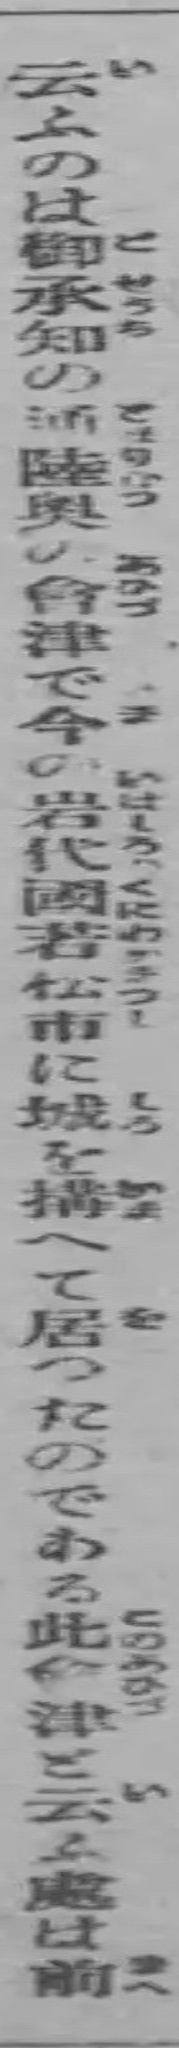云ふのは御承知の通陸奥の会津で今の岩代国若松市に城を構へて居つたのである此会津と云ふ処は前
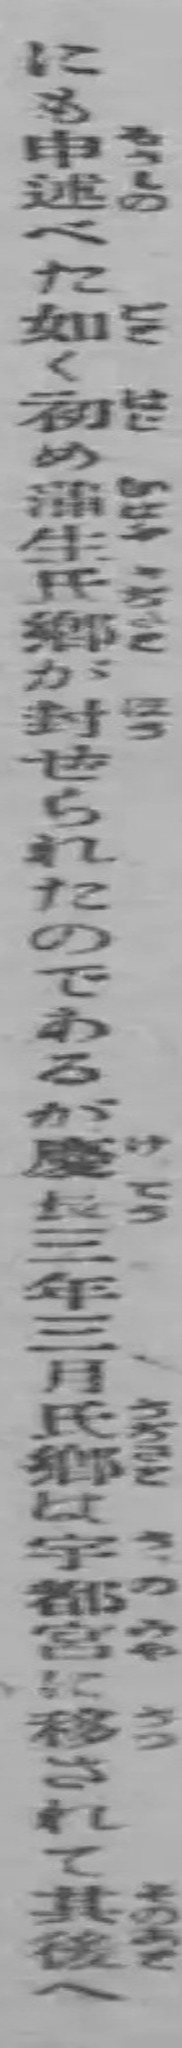にも申述べた如く初め蒲生氏郷が封ぜられたのであるが慶長三年三月氏郷は宇都宮に移されて其後へ
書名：豊橋市史談
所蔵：国立国会図書館 National Diet Library, JAPAN
